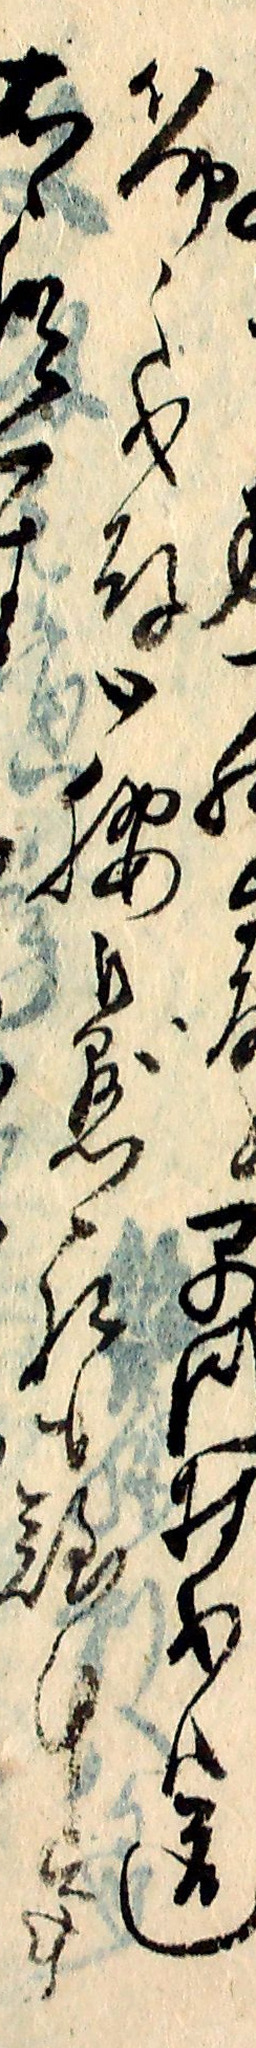筋之義故御腰被懸候哉も難計候付
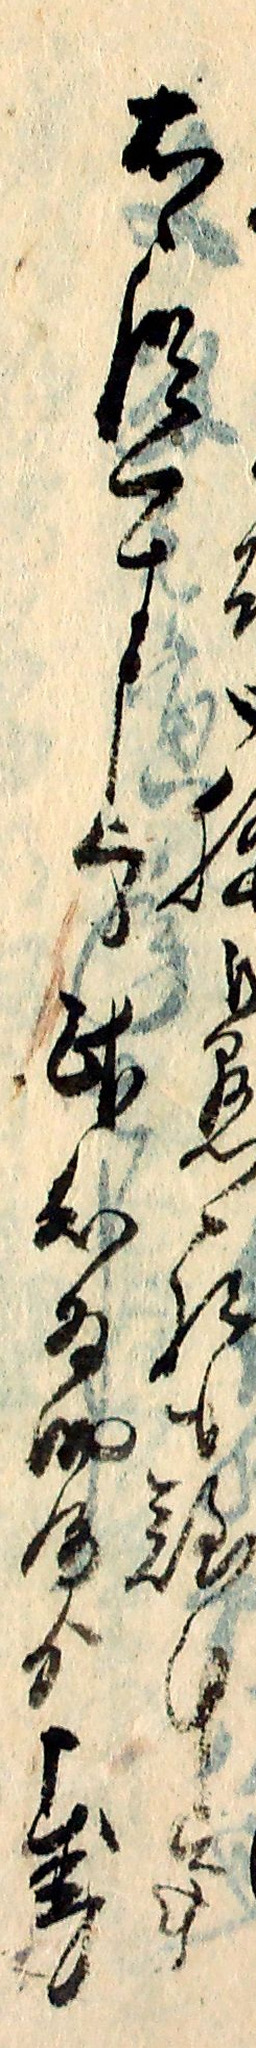右之段一寸申上候武知為助殿ゟ申置候

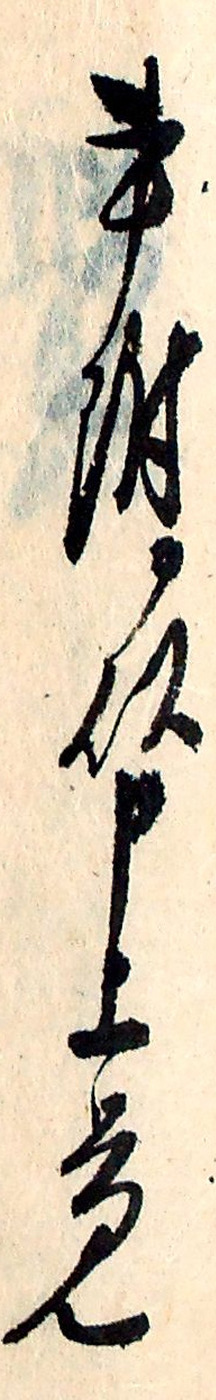書附を以申上覚
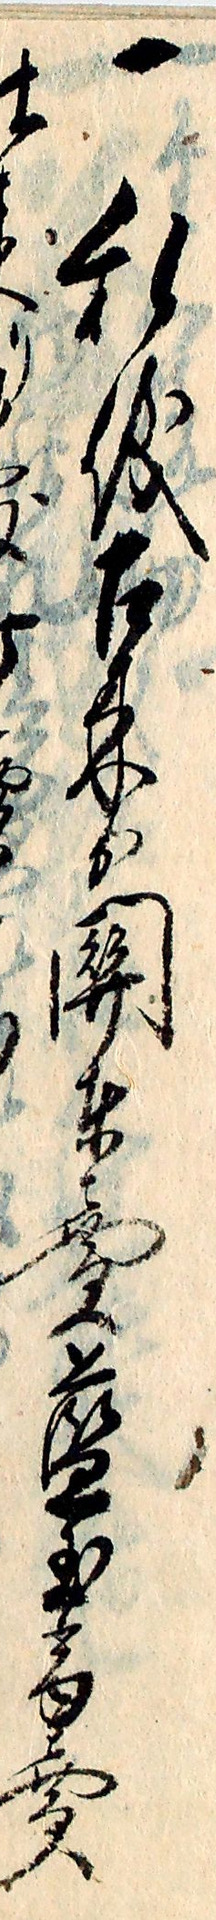一私儀古来ゟ関東売藍玉商売
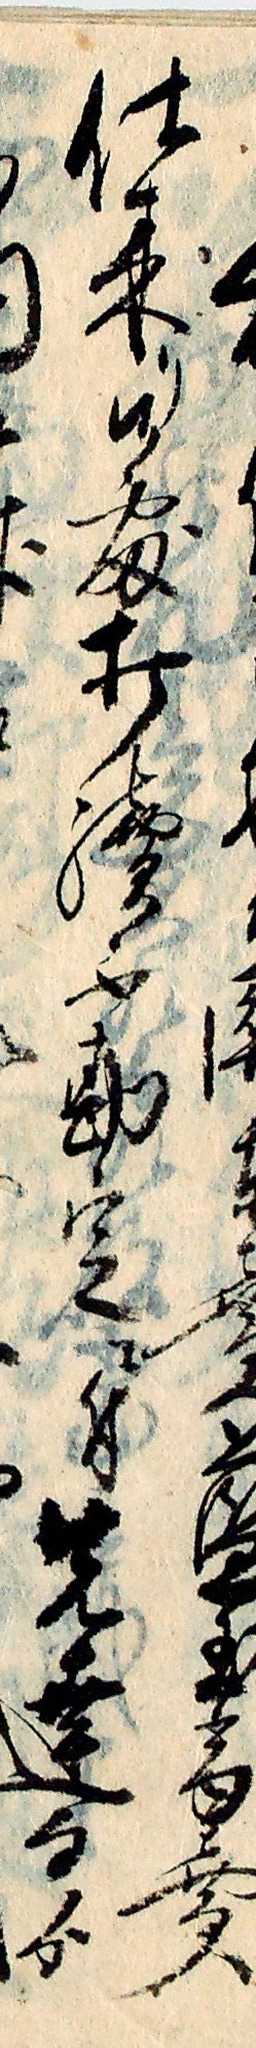仕来り候処打続不勘定に付先達てゟ
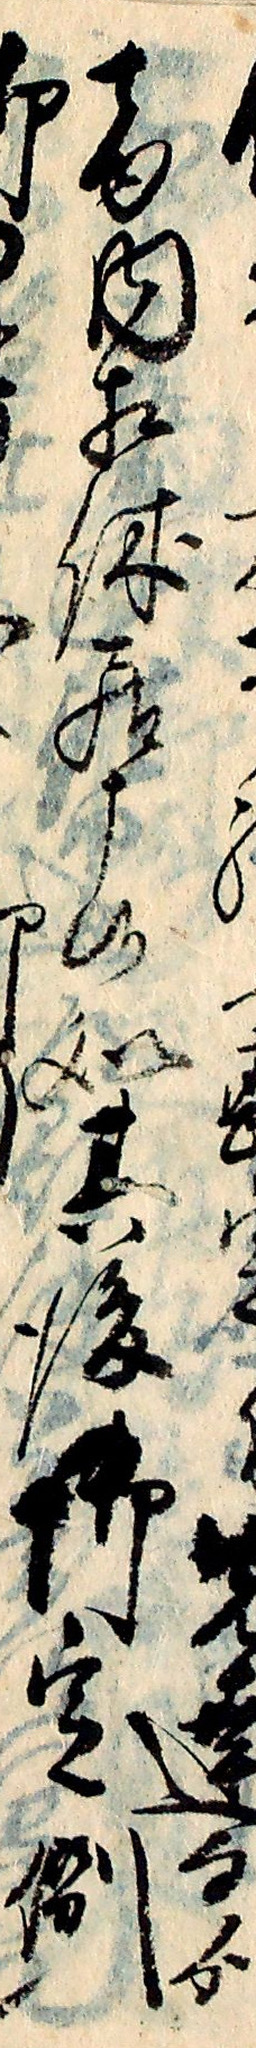商内相休居申候処其後御定例
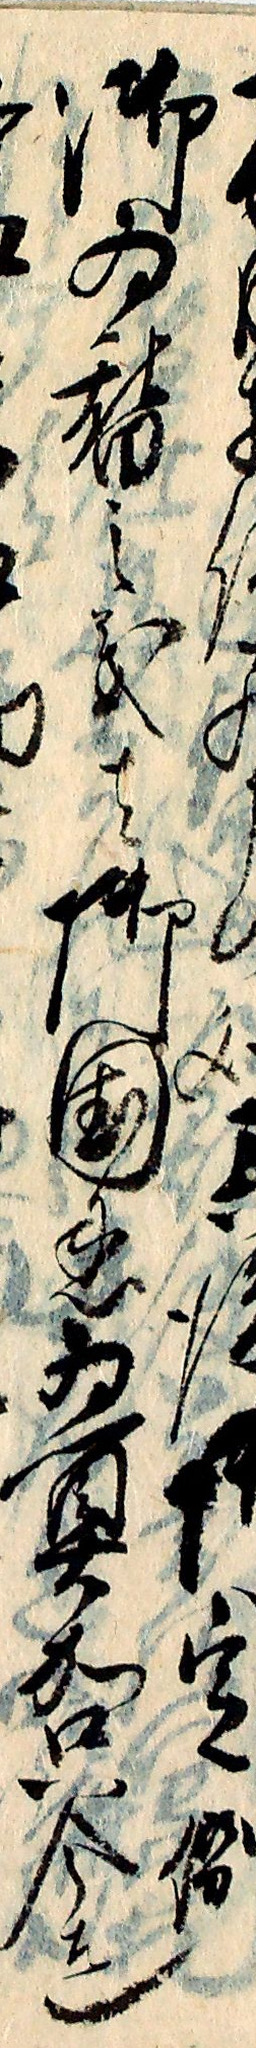御為替之義は御国恩為冥加只今迄
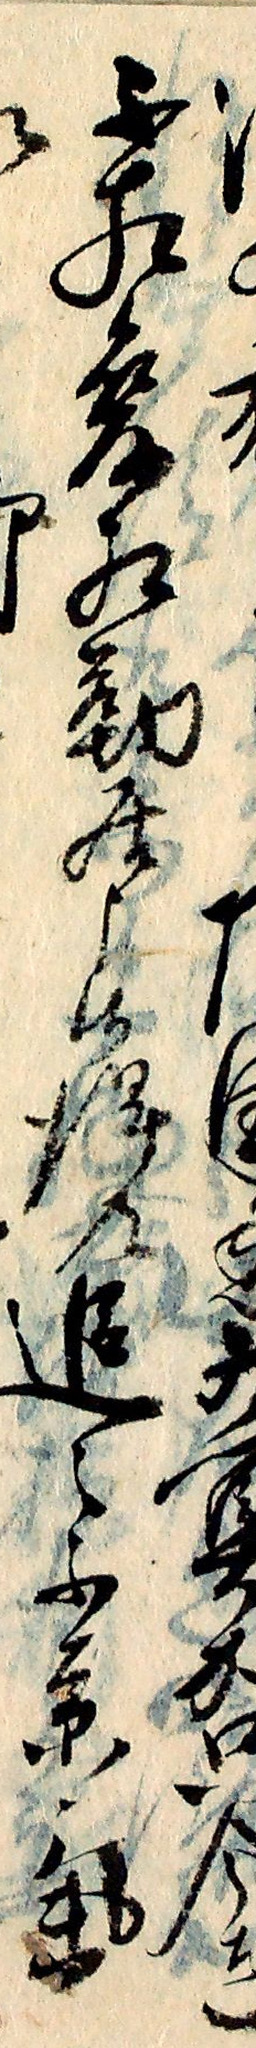不相変相勤居申候得共追々不景気
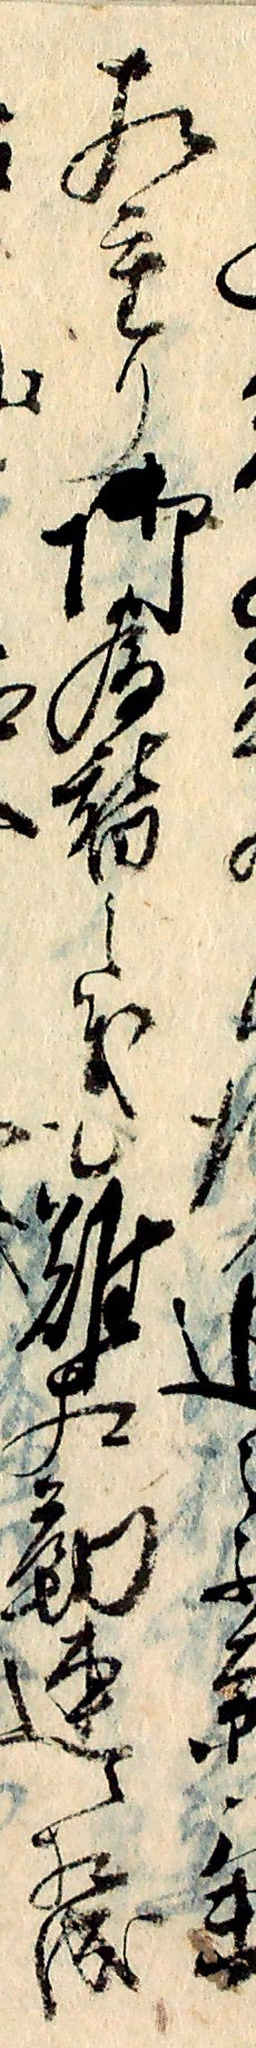相重り御為替之義も難相勤連々相成
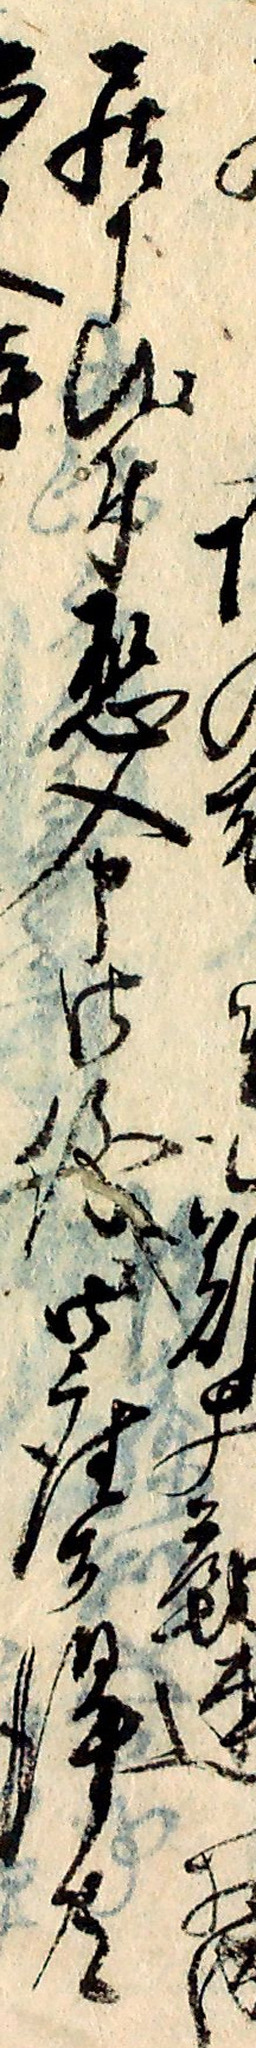居申候に付恐入申御儀に御座候得共
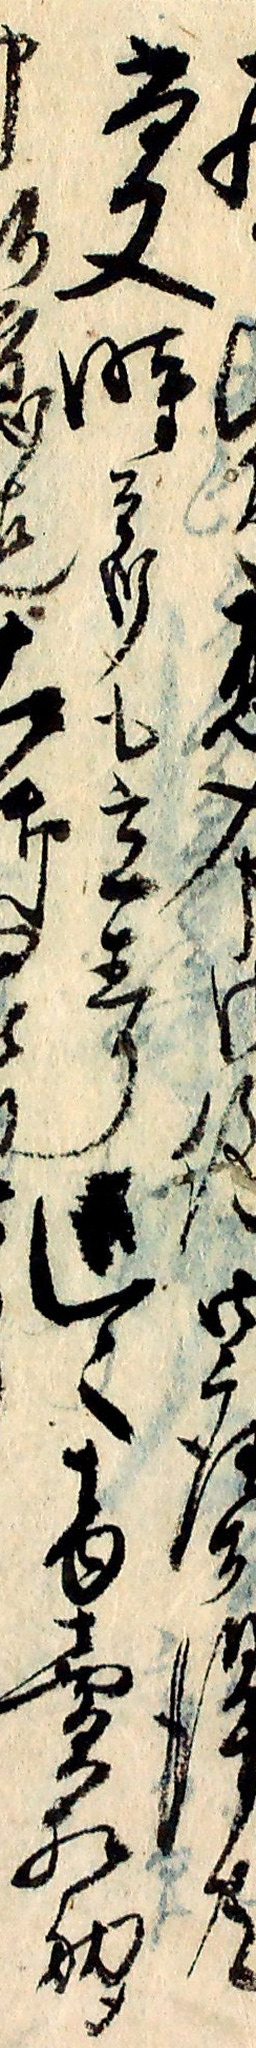尚又時節も立直り追々商売相初め
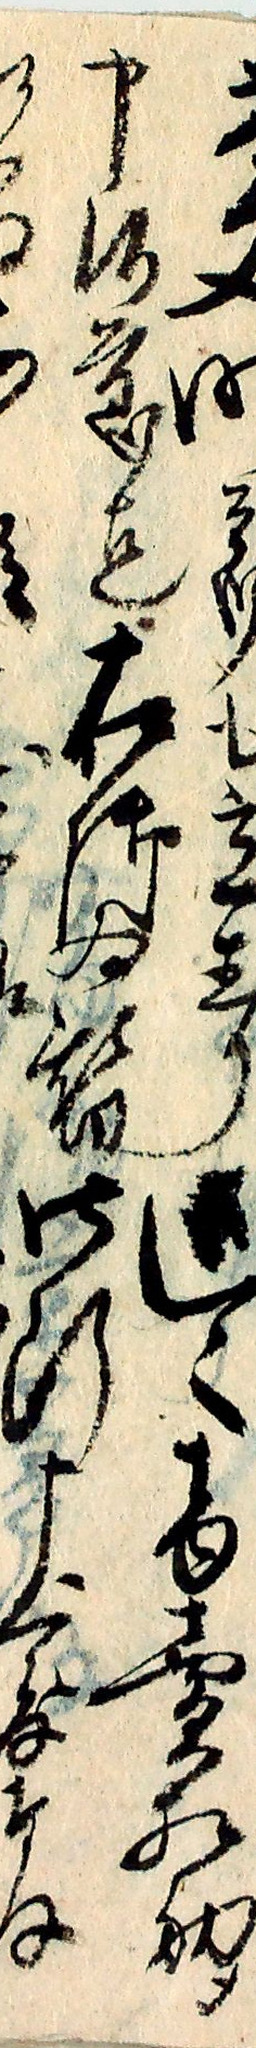申候節迄右御為替御断申上度奉存
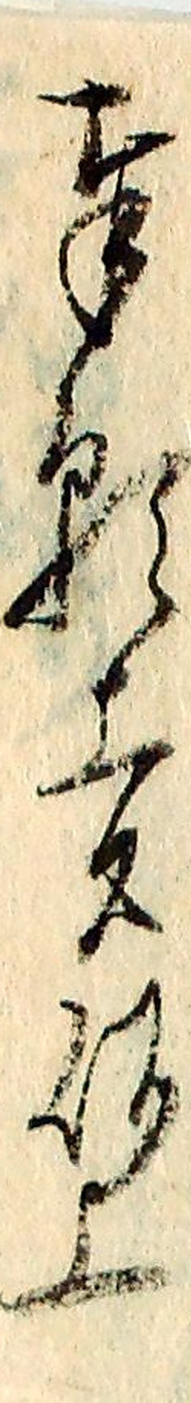奉願上候以上
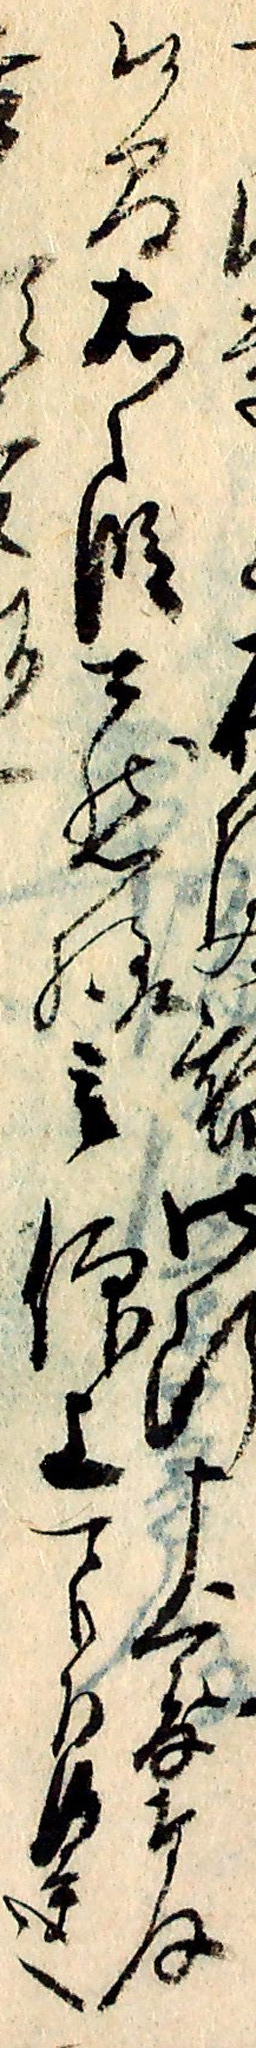候間右之段可然様被仰上可被下候重々
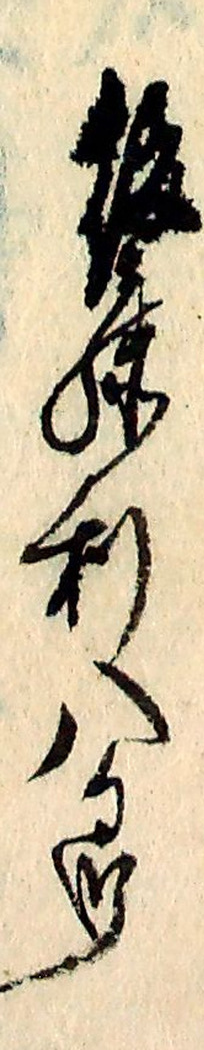後藤利八郎
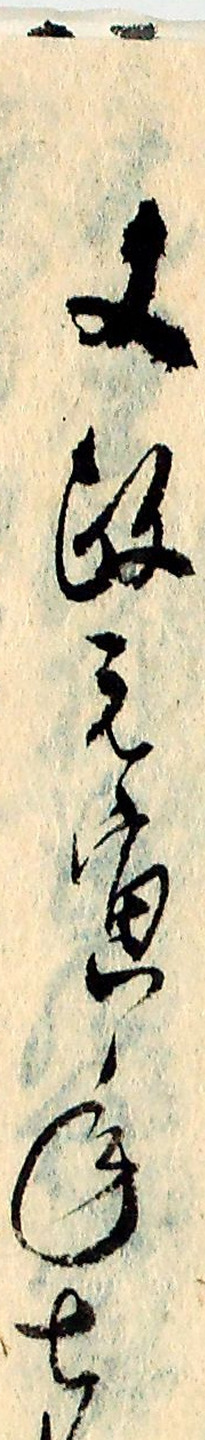文政元寅年七月
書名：諸御願書控(後藤氏壱番）
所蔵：鳴門教育大学 Naruto University of Education
